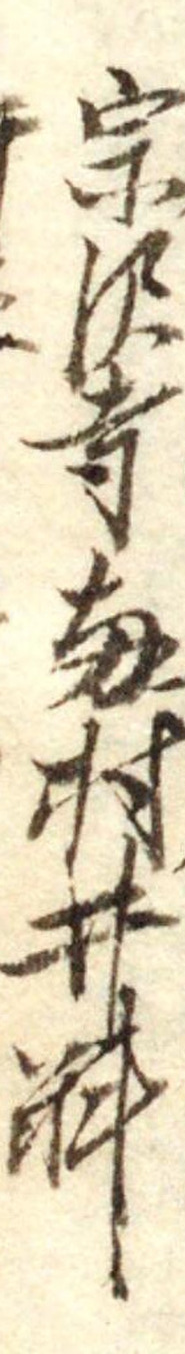宗沢寺両村井料
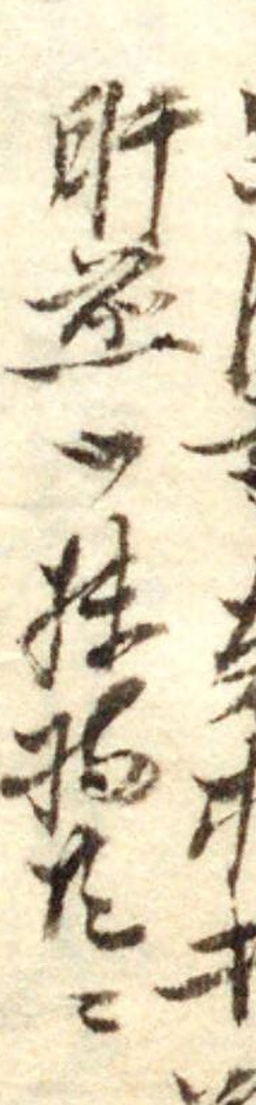肝煎御扶持共に

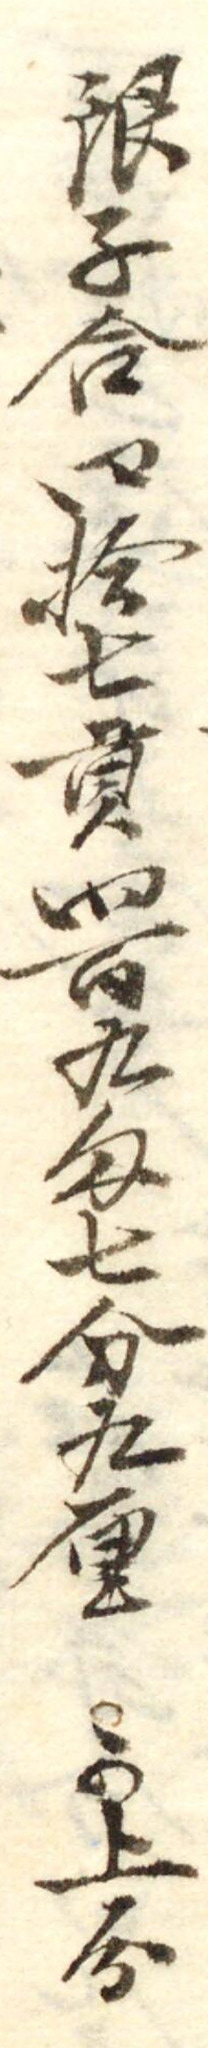銀子合四拾七貫四百九匁七分九厘可上分
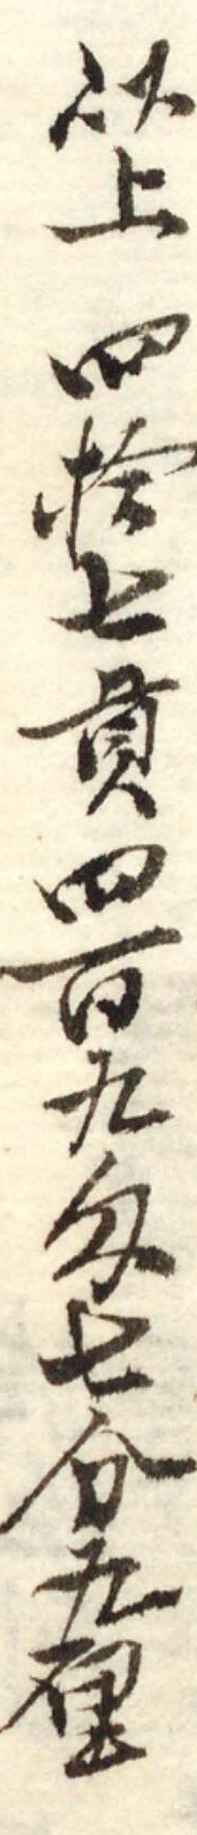以上四拾七貫四百九匁七分九厘
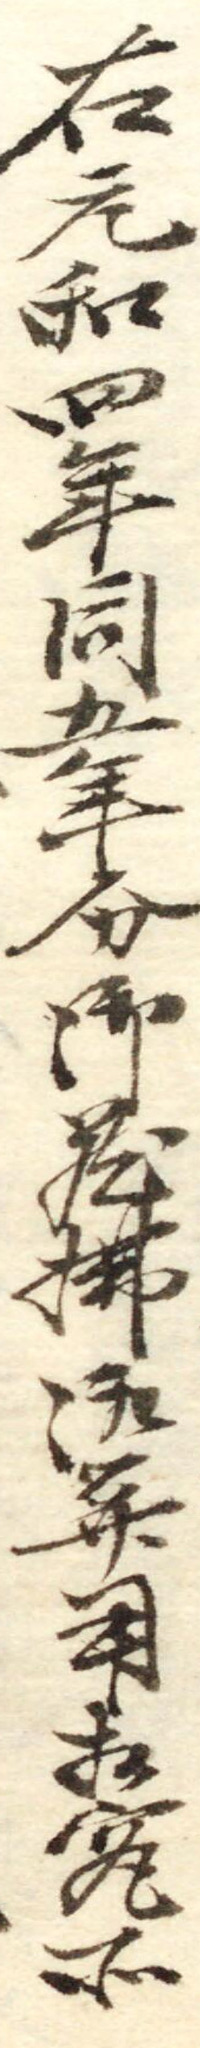右元和四年同五年分御蔵払御算用相究所
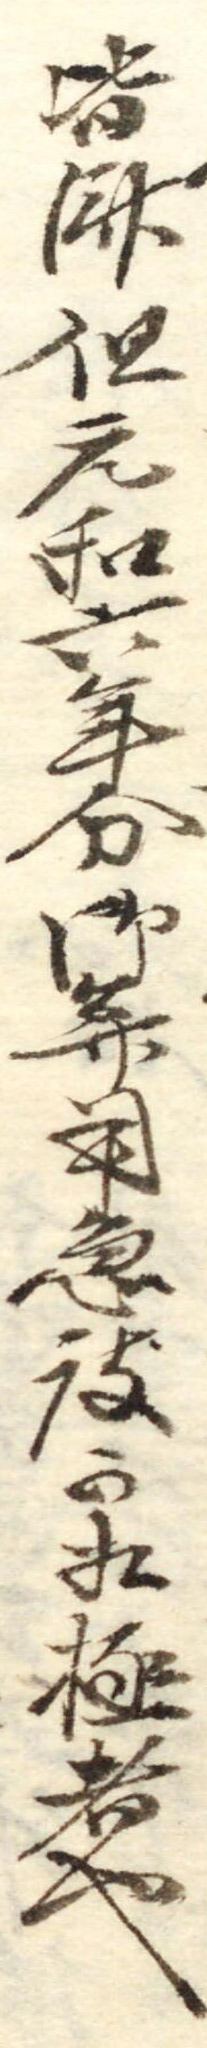皆済但元和六年分御算用急度可相極者也
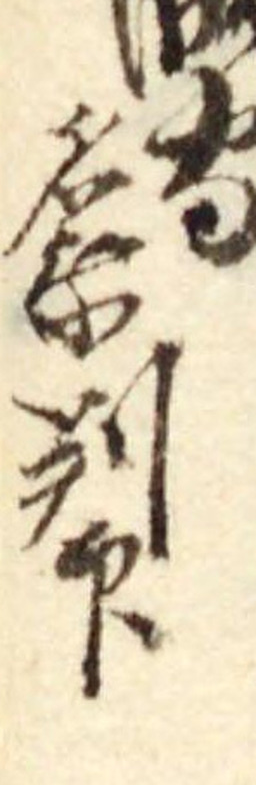名乗判印
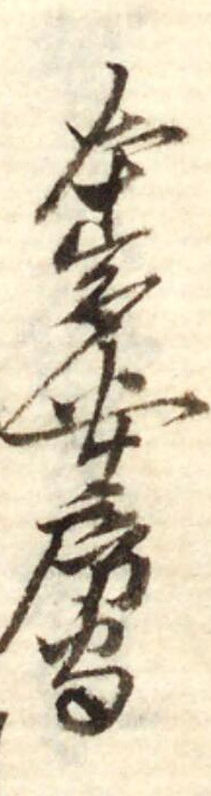本多安房守
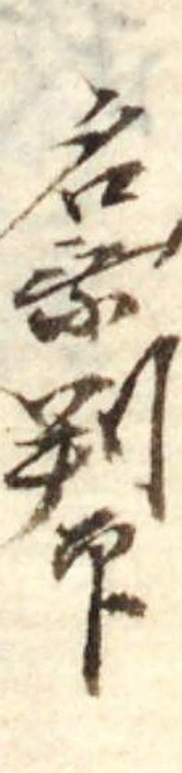名乗判印
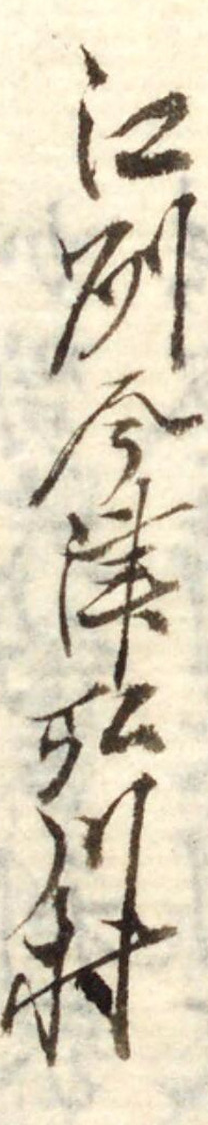江州今津弘川村
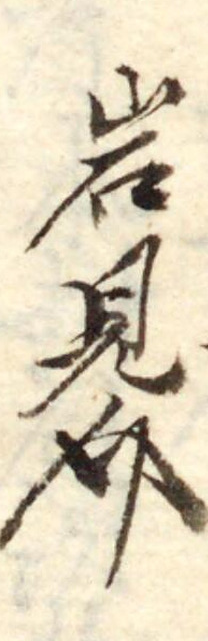岩見介
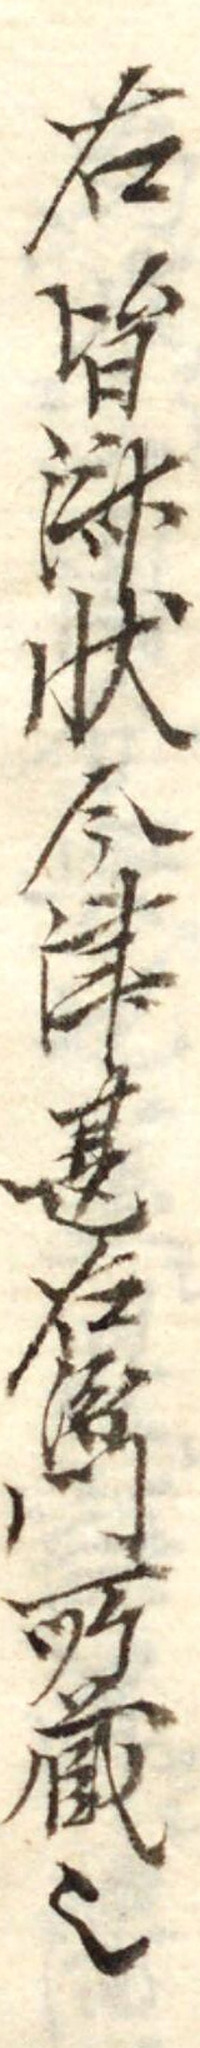右皆済状今津甚右衛門所蔵也
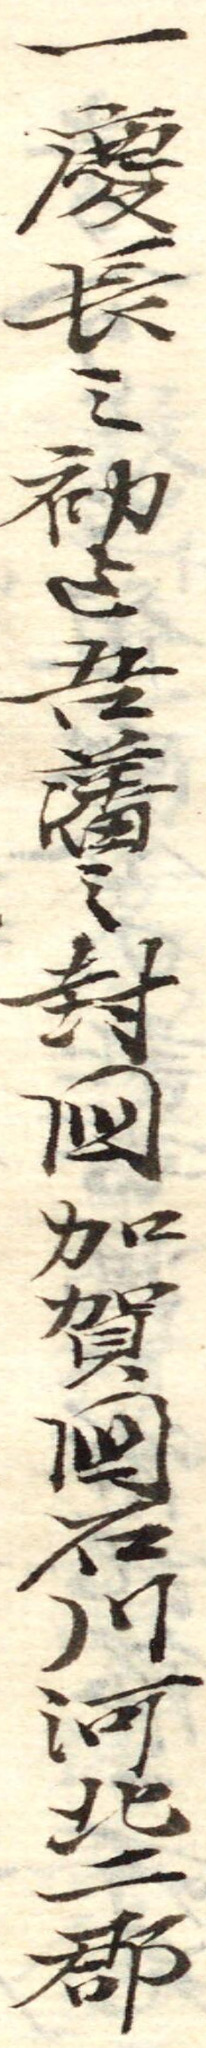一慶長之初迄吾藩之封国加賀刻石川河北二郡
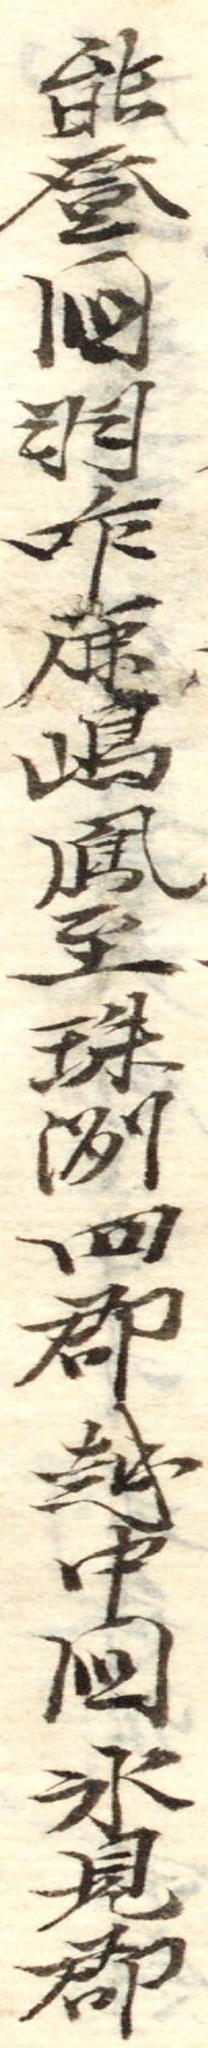能登国羽咋鹿島鳳至珠洲四郡越中国氷見郡
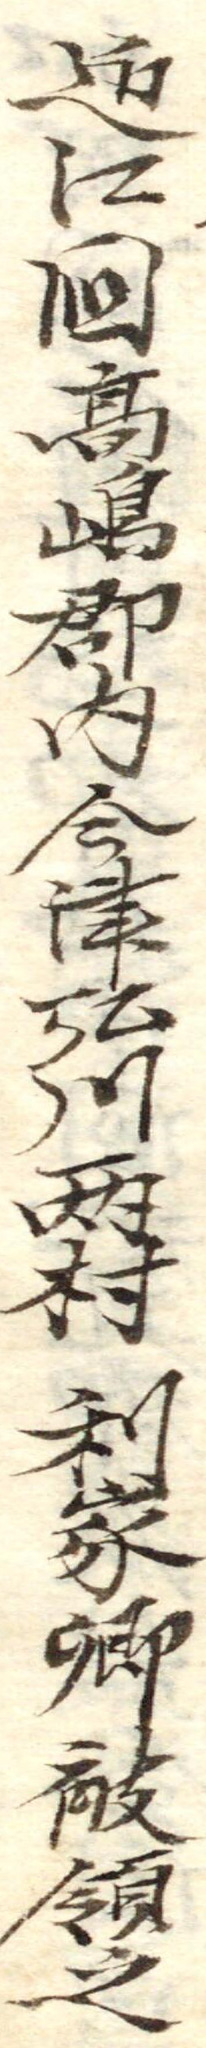近江国高島郡内今津弘川両村利家卿被領之
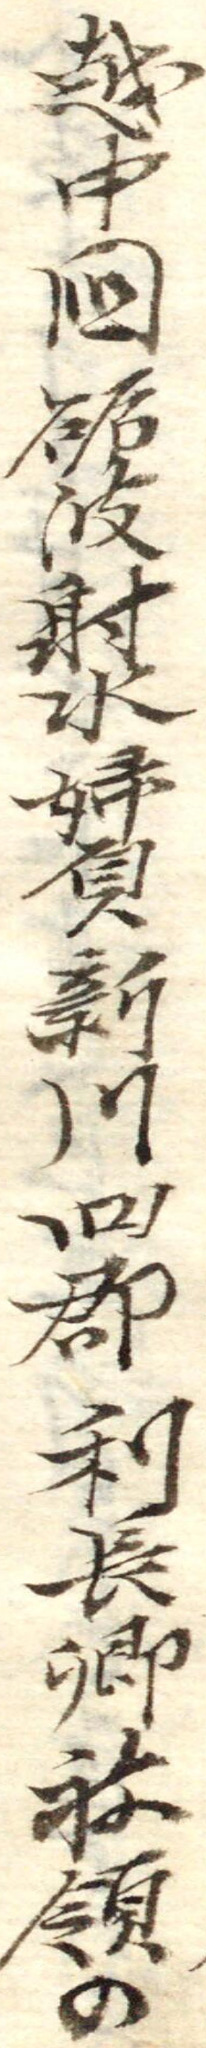越中国砺波射水婦負新川四郡利長卿被領の
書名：前田家封国証書集録
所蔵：Ishikawa Prefectural Library
